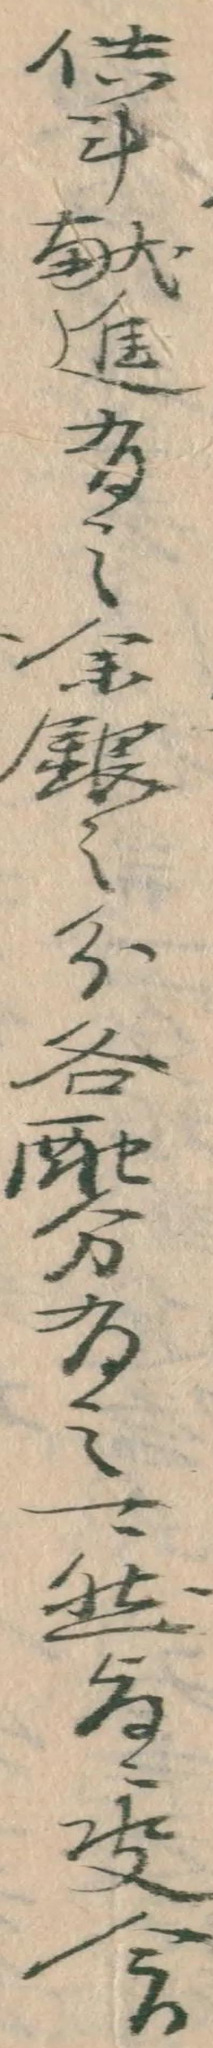供計献進有之余銀之分各配分有之可然旨に決今日
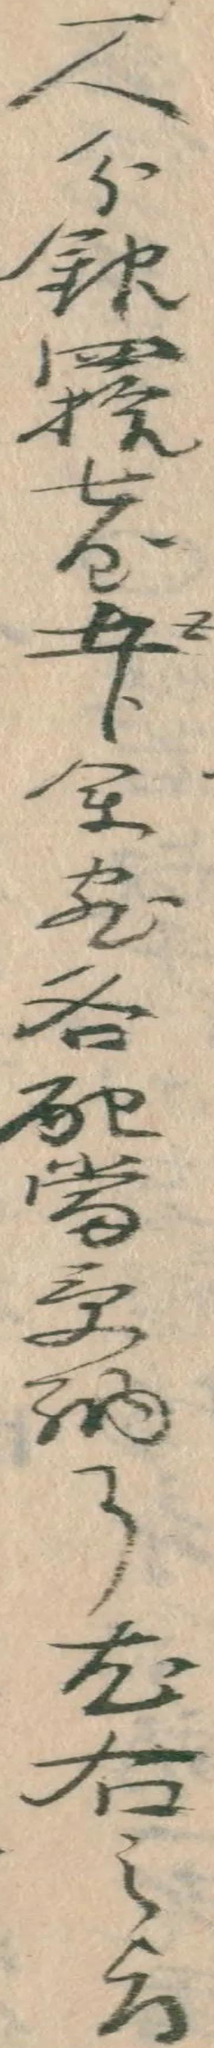一人分銀四拾七匁五分余宛各配当受納了尤右之旨
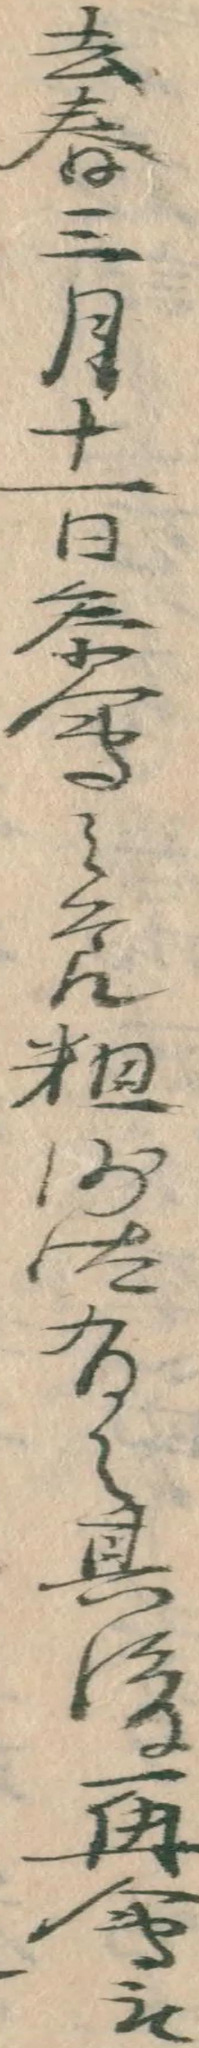去春三月十一日参会之節粗沙汰有之其後再会被
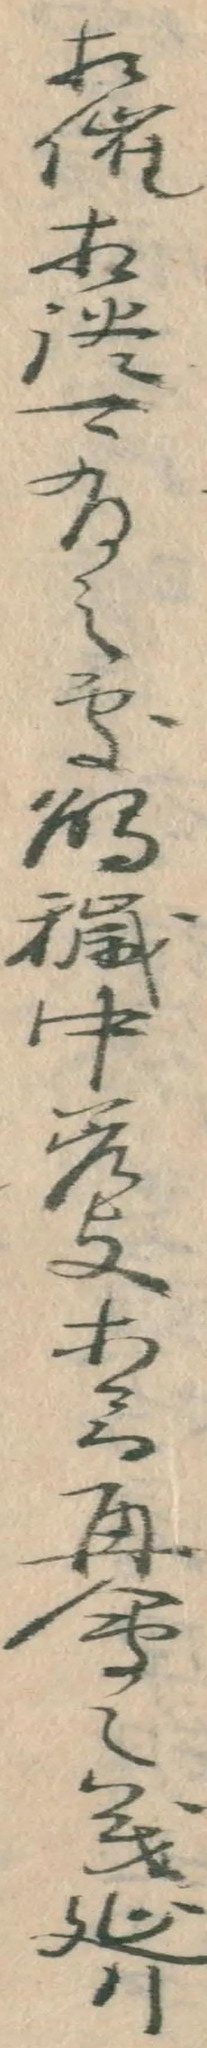相催相談可有之処触穢中差支等ニ而再会之義延引
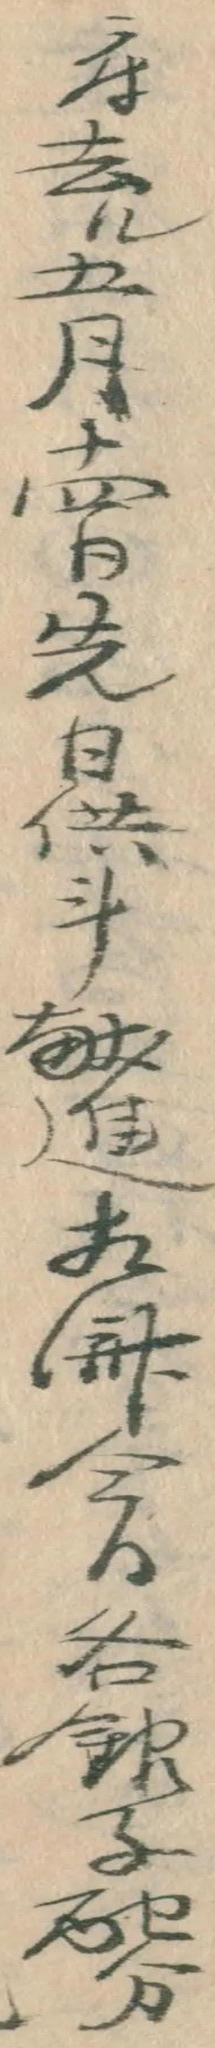に付去ル五月十四日先日供計献進相済今日各銀子配分
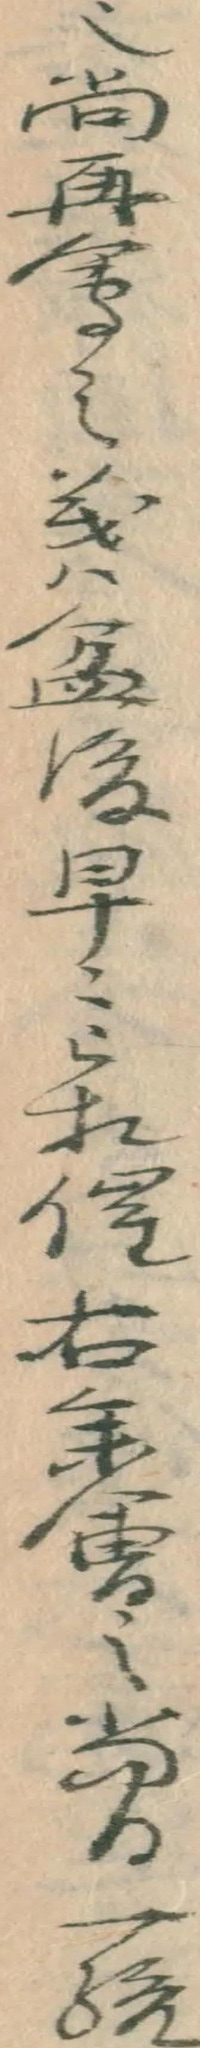也尚再会之義は盆後早々被相催右参会之当日一統

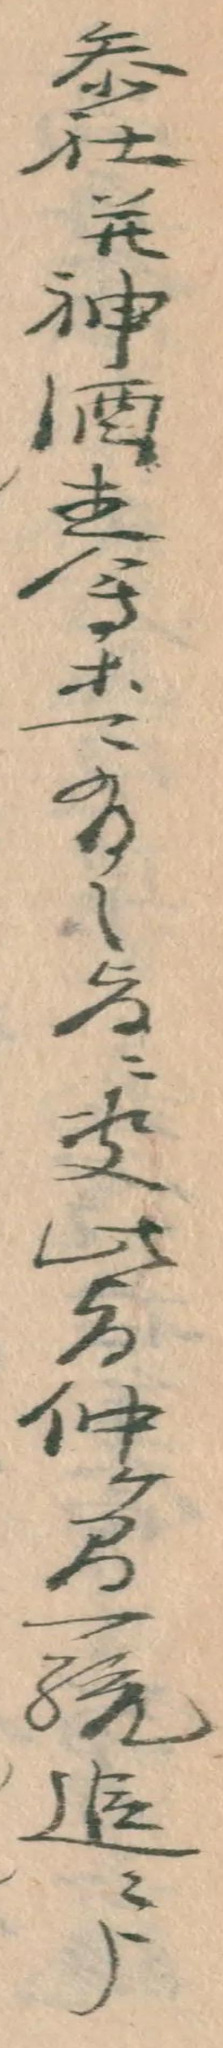参社並神酒直会等可有之旨ニ決此旨仲ケ間一統追々申
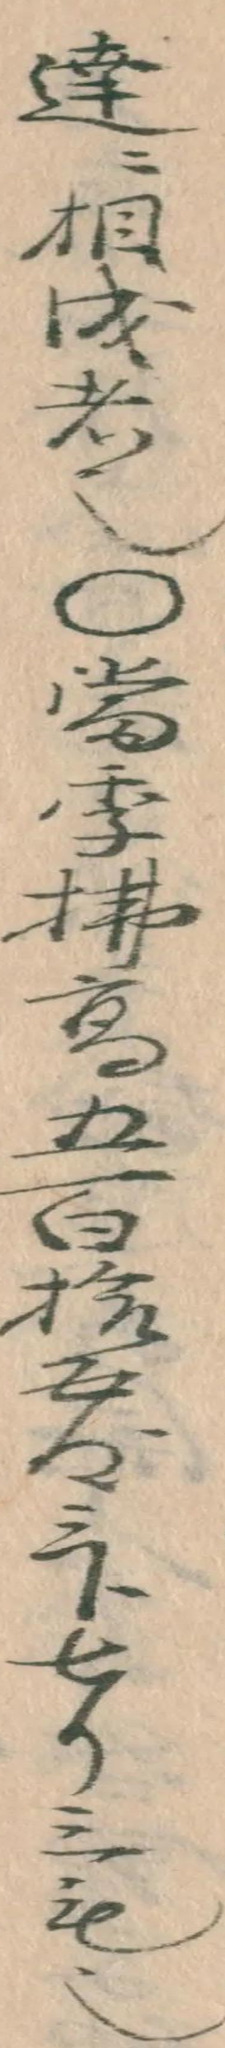達ニ相成者也〇当季払高五百拾五匁三分七り三毛也
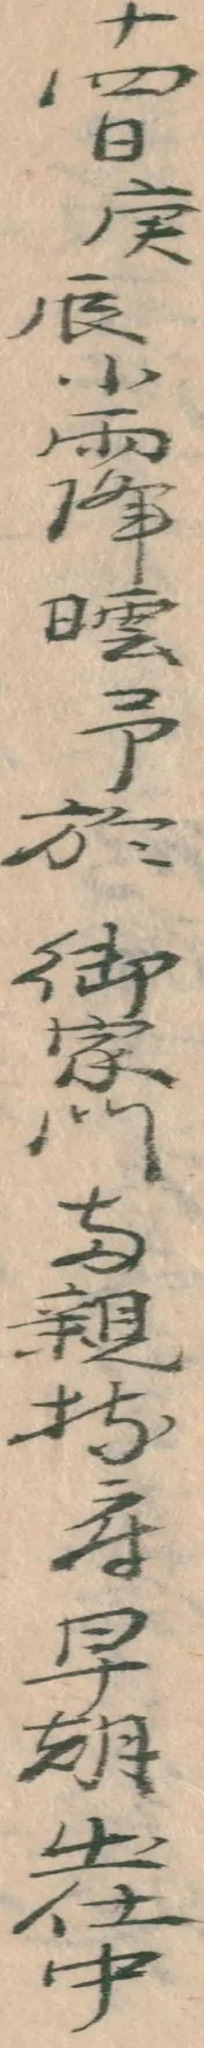十四日庚辰小雨降曇予於御家門両親持ニ付早朝出仕中
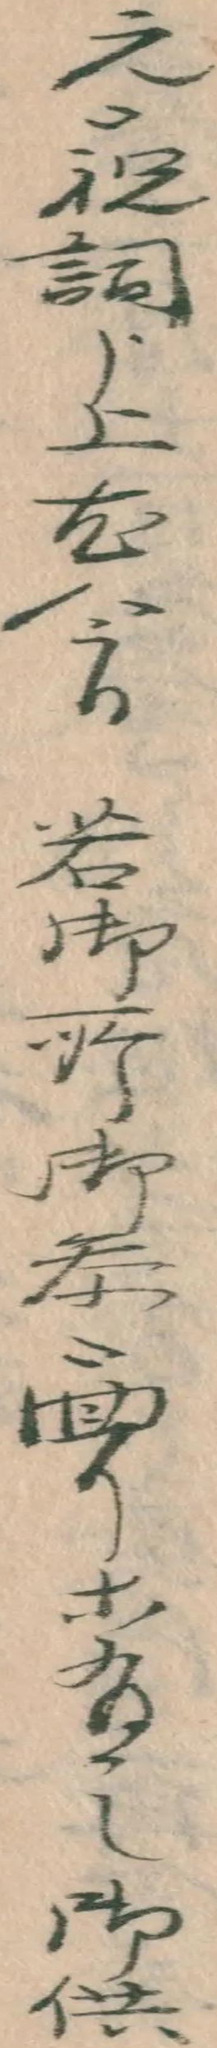元御祝詞申上尤今日若御所御参御回り等有之御供
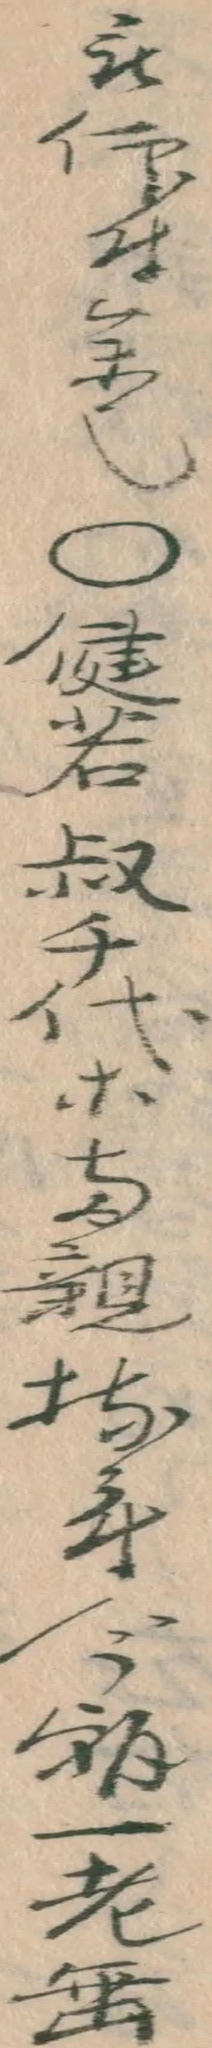被仰付参也〇健若叔千代等両親持ニ付今朝一老垂
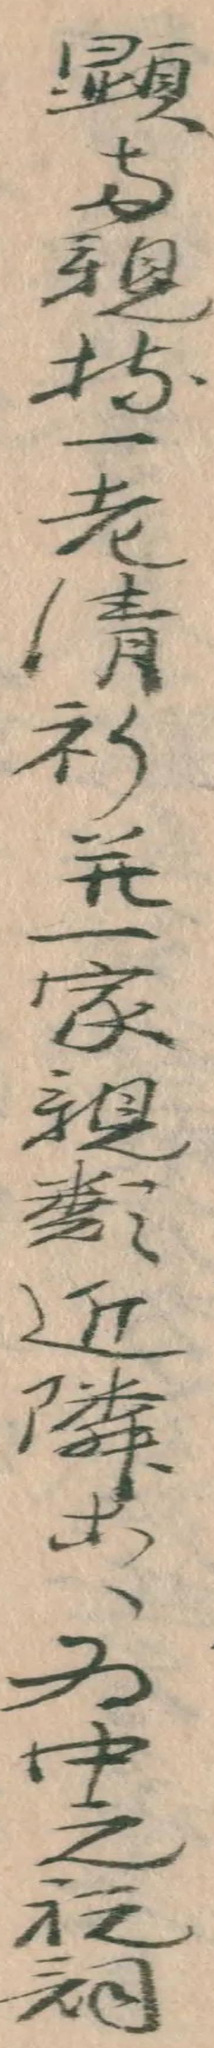顕両親持一老清祈並一家親類近隣等へ為中元祝詞
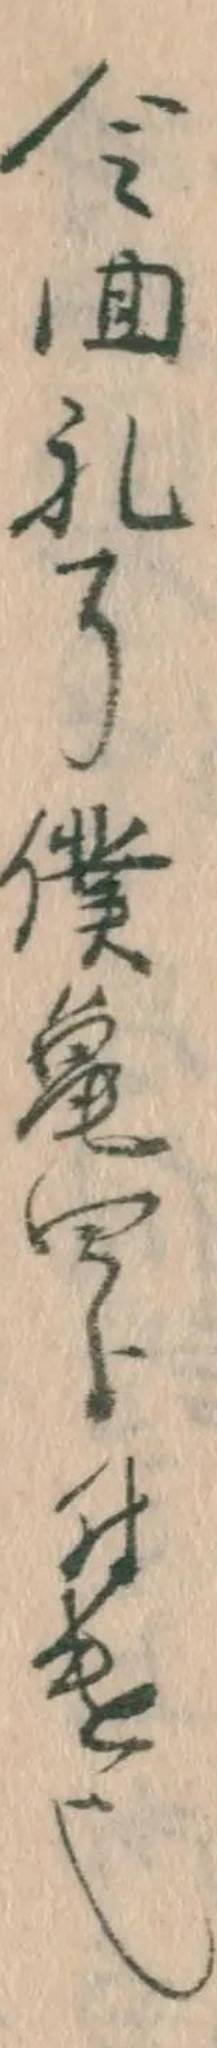令回礼了僕亀四郎付遣也
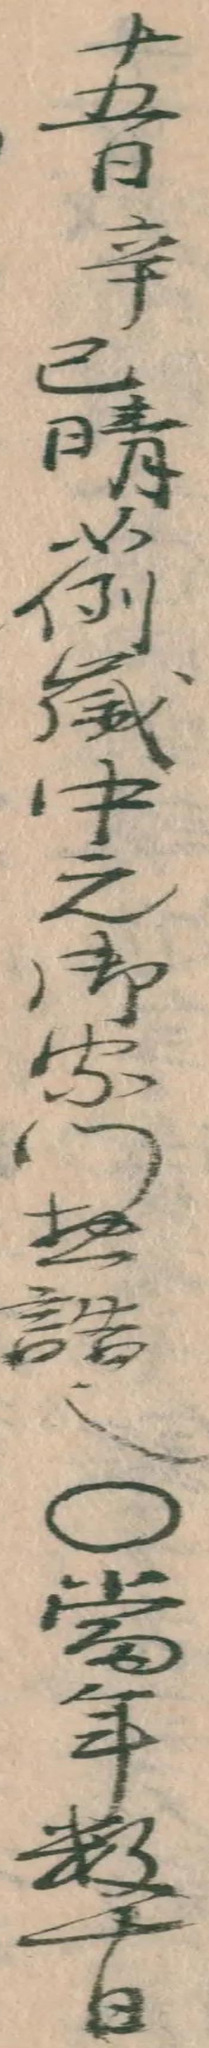十五日辛巳晴如例歳中元御家門惣詰也〇当年数十日
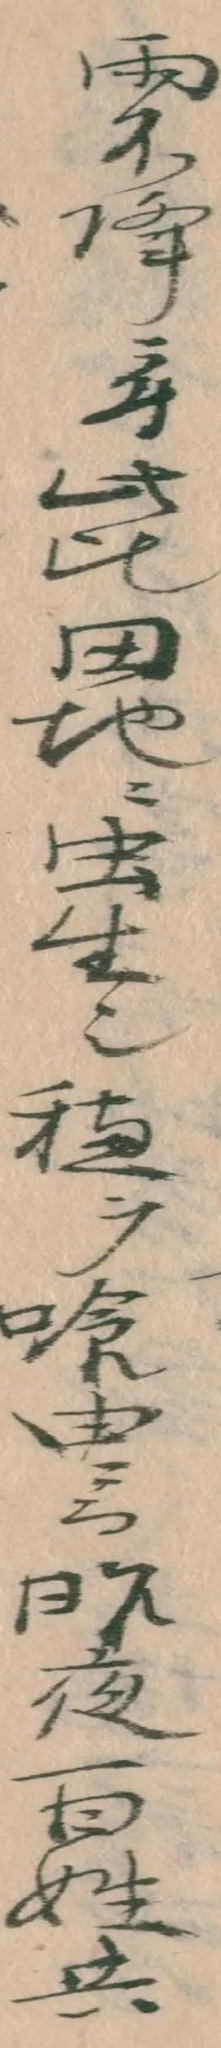雨不降ニ付此頃田地ニ虫生シ穂ヲ喰由ニ而昨夜百姓共
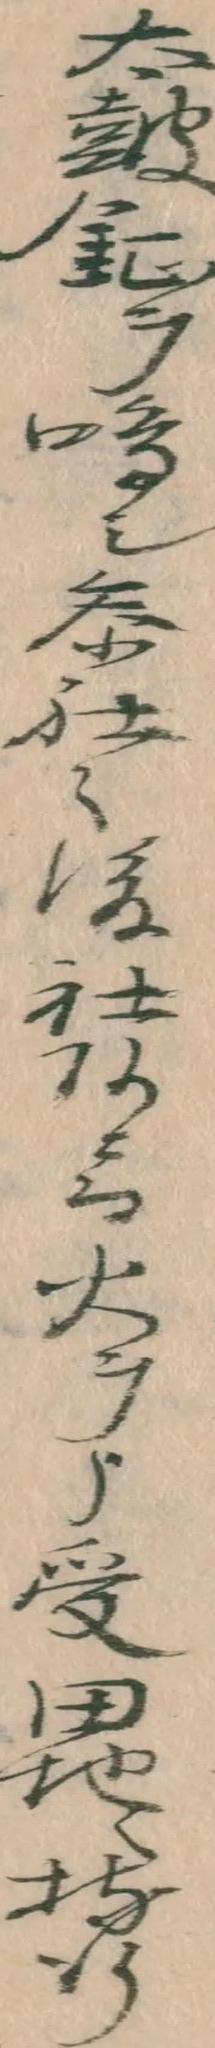太鼓鉦ヲ鳴シ参社之後社頭ニ而火ヲ申受田地へ持行
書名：賀茂社記録. 第64冊
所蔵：国立国会図書館 National Diet Library, JAPAN
